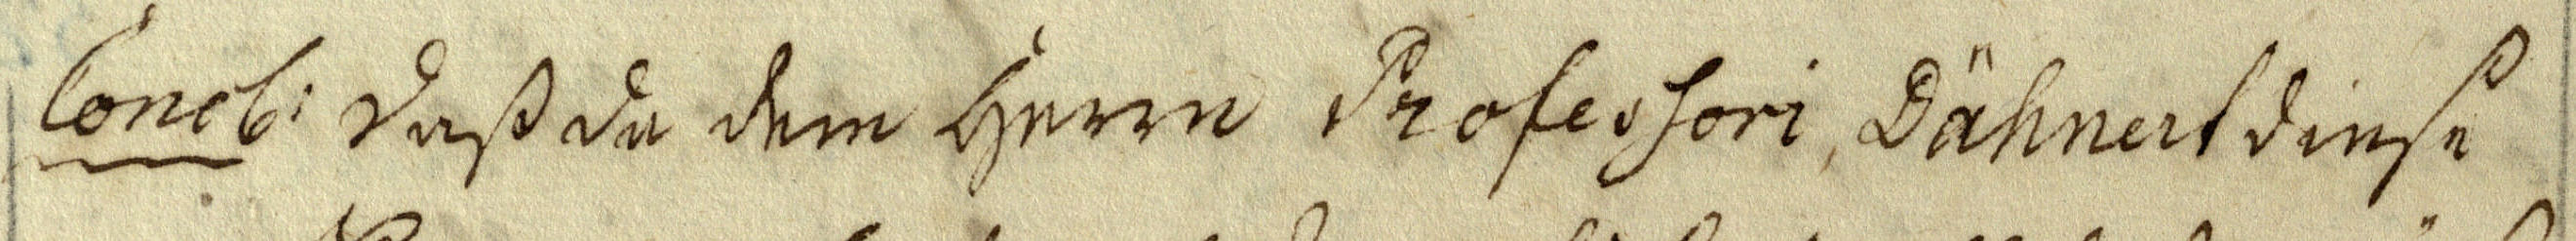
Concl. Daß da dem Herrn Professori Dähnert diese
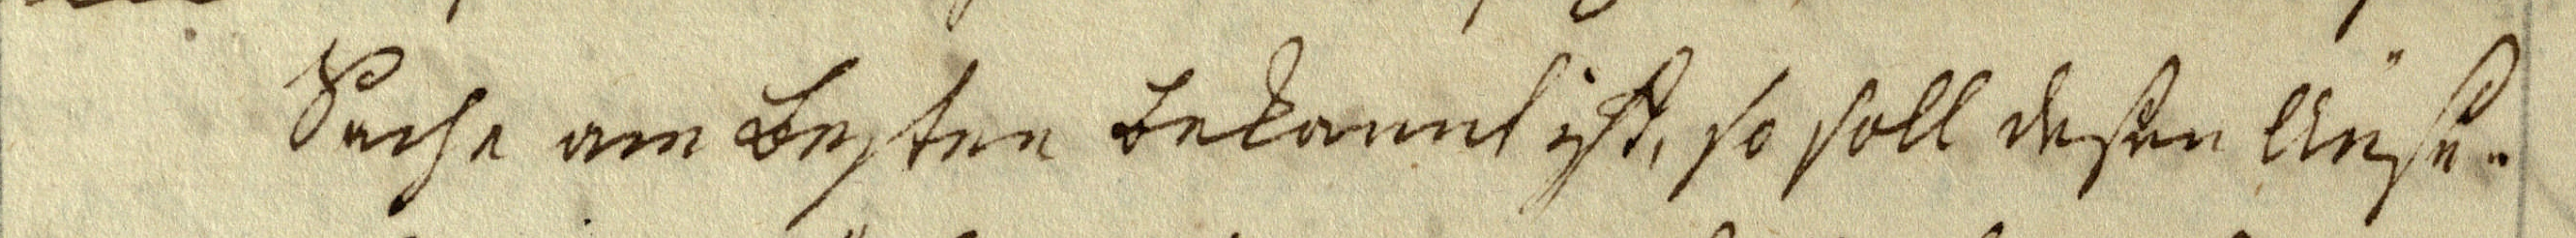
Sache am Besten bekannt ist, so soll deßen Äuße¬
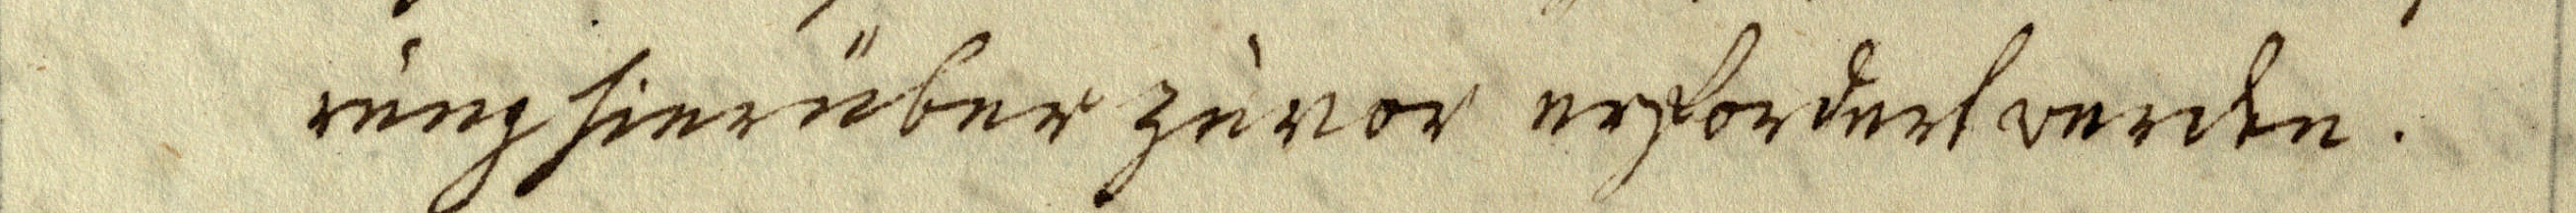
rung hierüber zuvor erfordert werden.
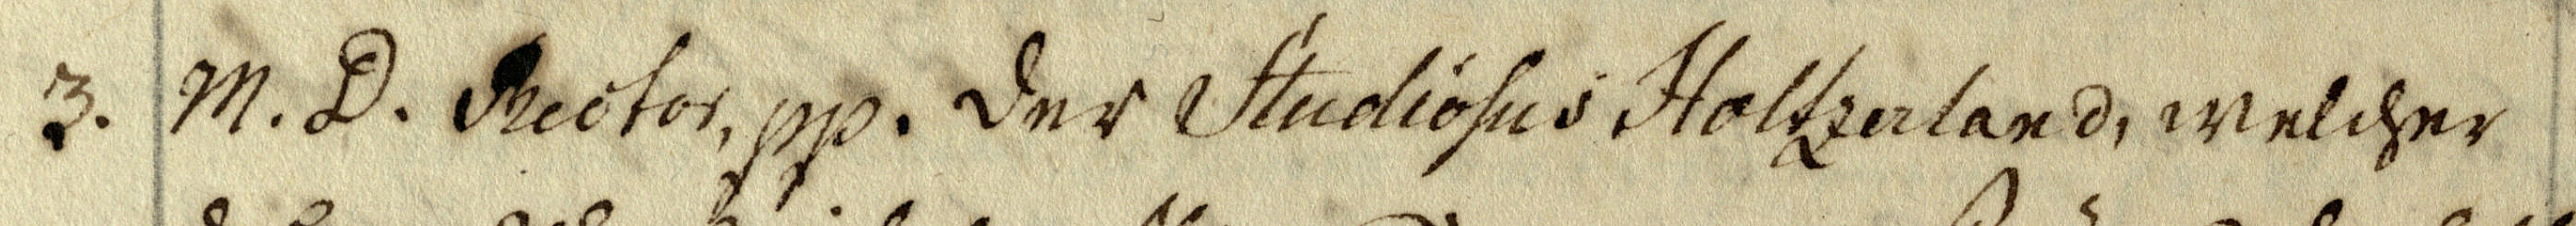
3. M. D. Rector pp. Der Studiosus Holtzerland, welcher
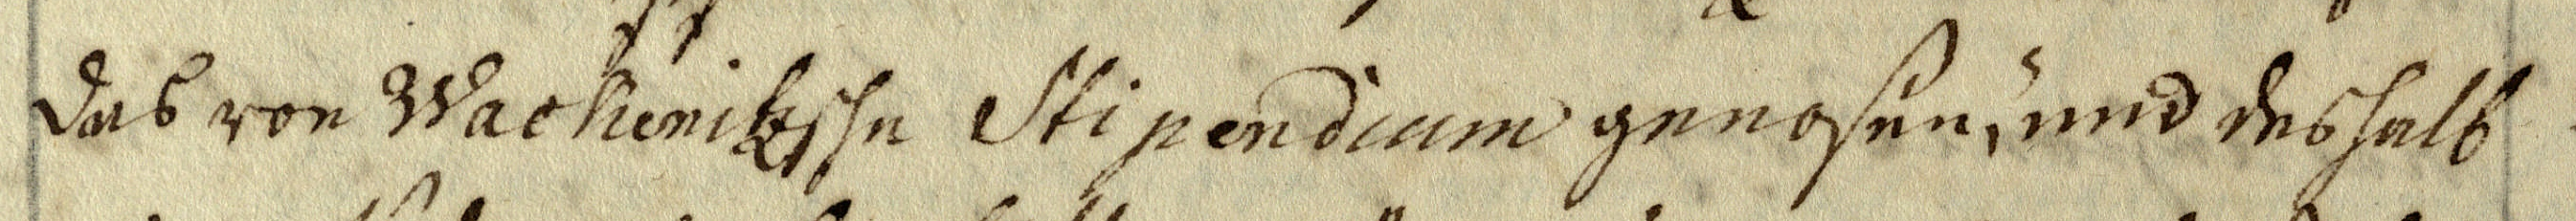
das von Wackenitzsche Stipendium genoßen, und deshalb
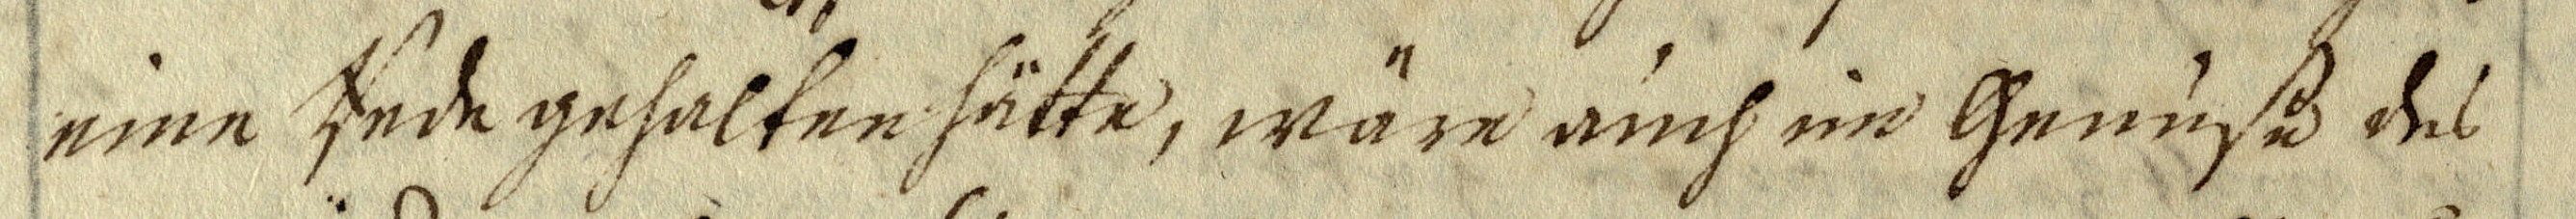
eine Rede gehalten hätte, wäre auch im Genuße des
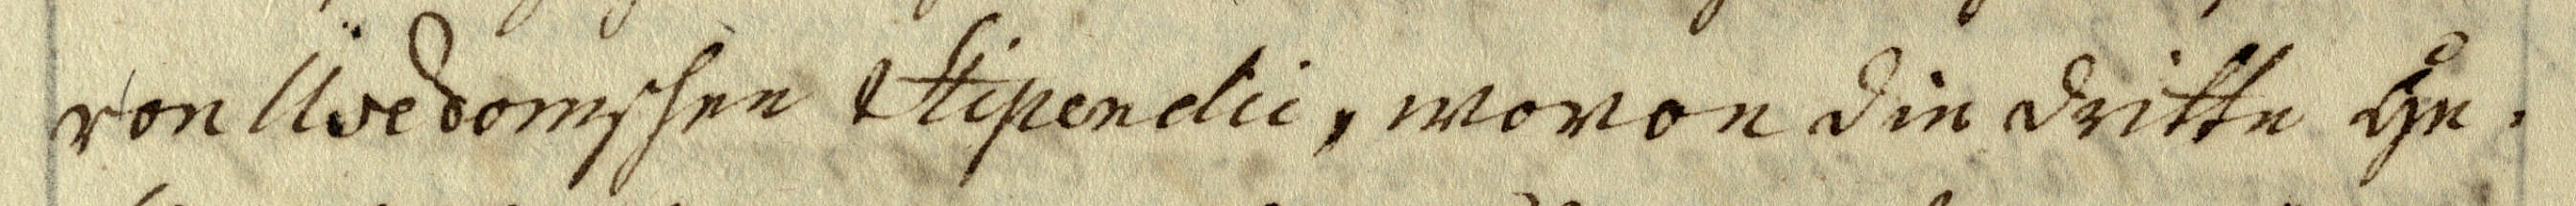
von Usedomschen Stipendii, wovon die dritte He¬
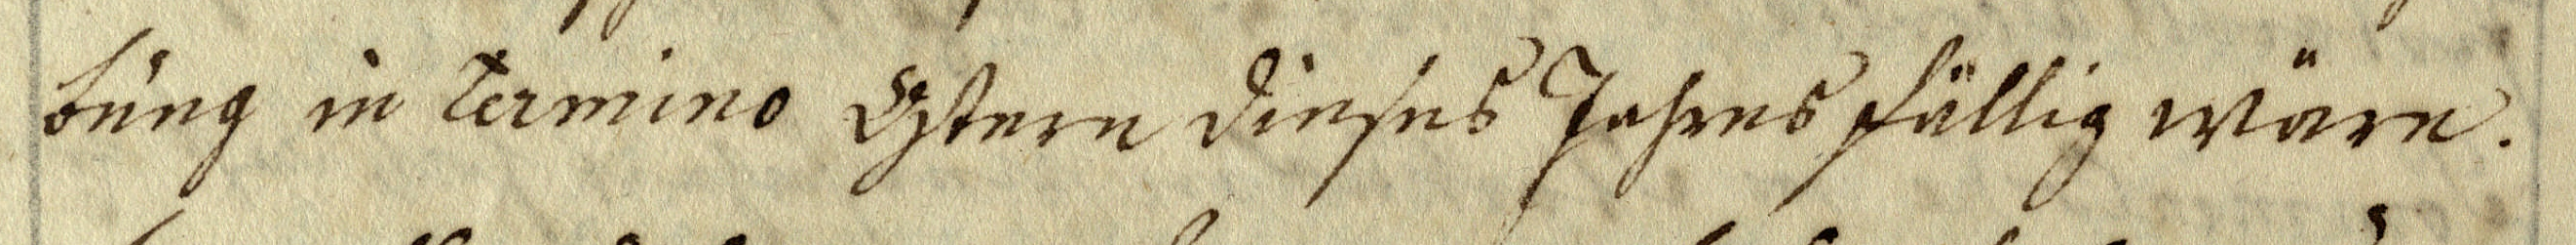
bung in Termino Ostern dieses Jahres fällig wäre.
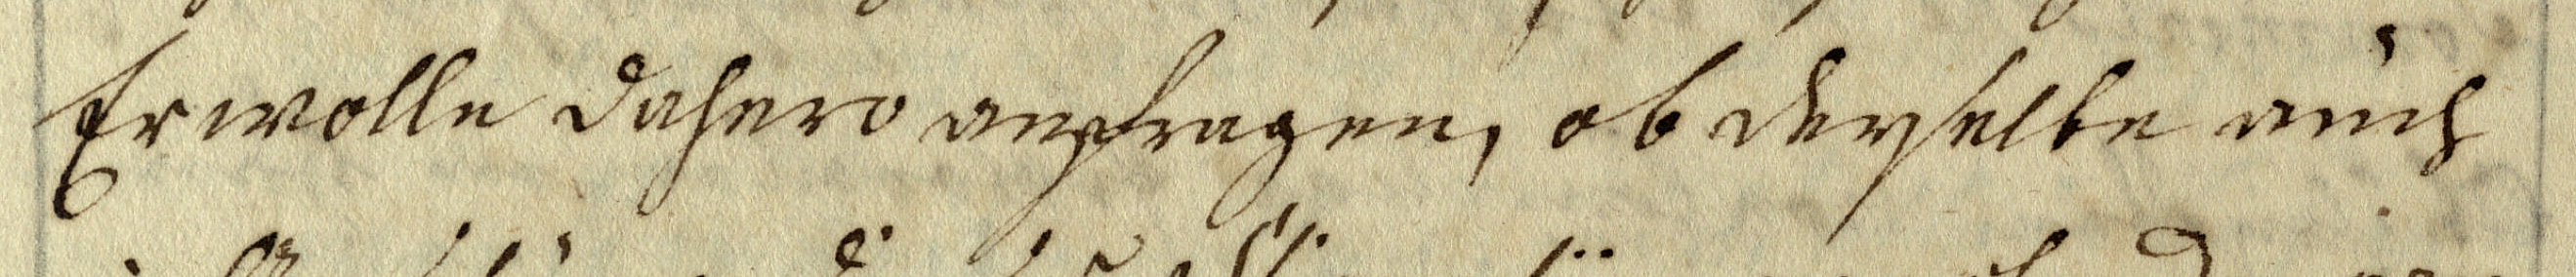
Er wolle dahero anfragen, ob derselbe auch
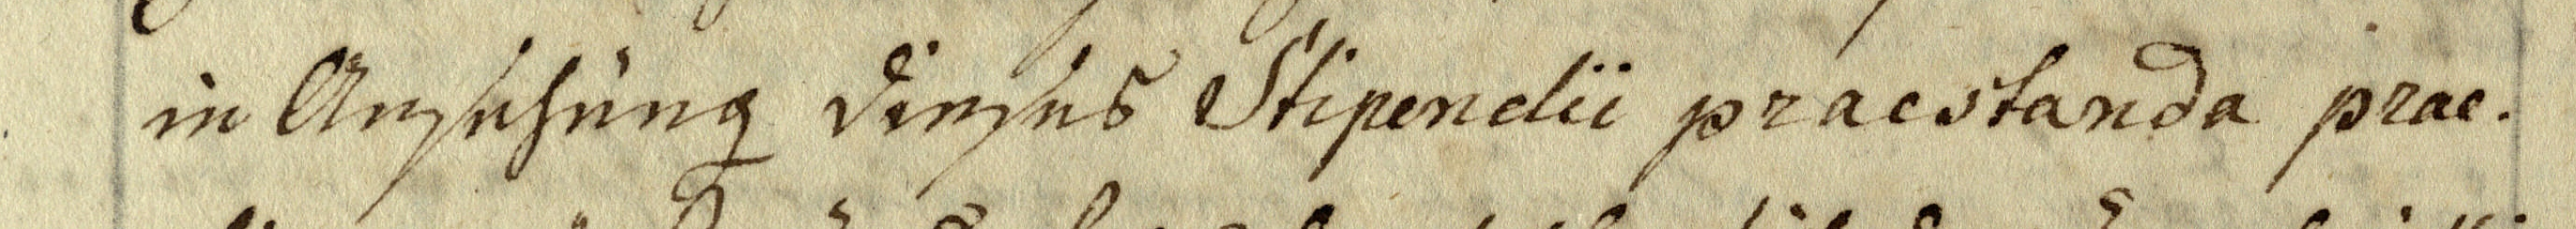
in Ansehung dieses Stipendii praestanda prae¬
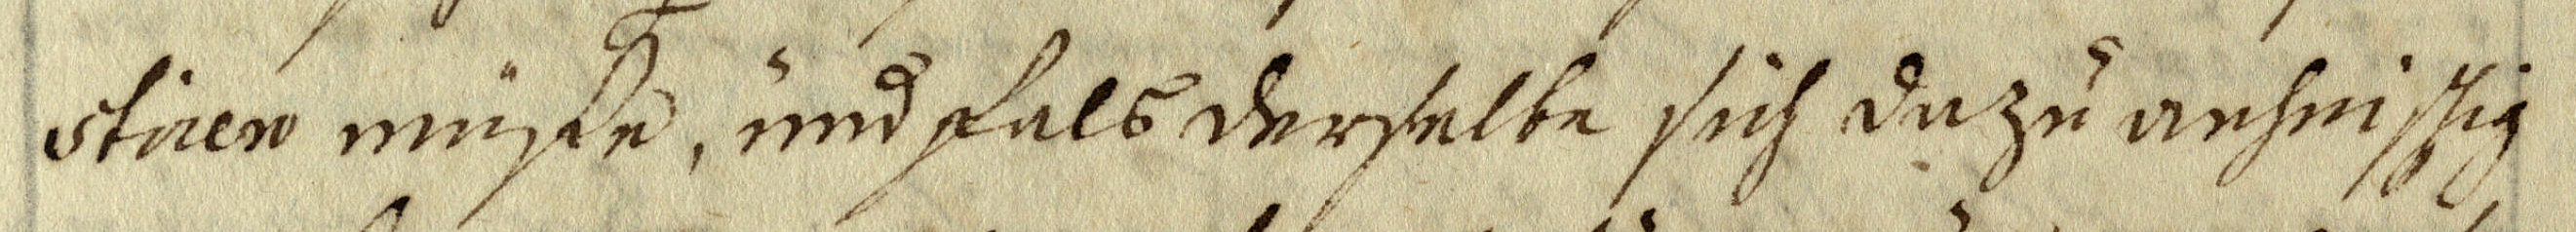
stiren müße, und fals derselbe sich dazu anheischig
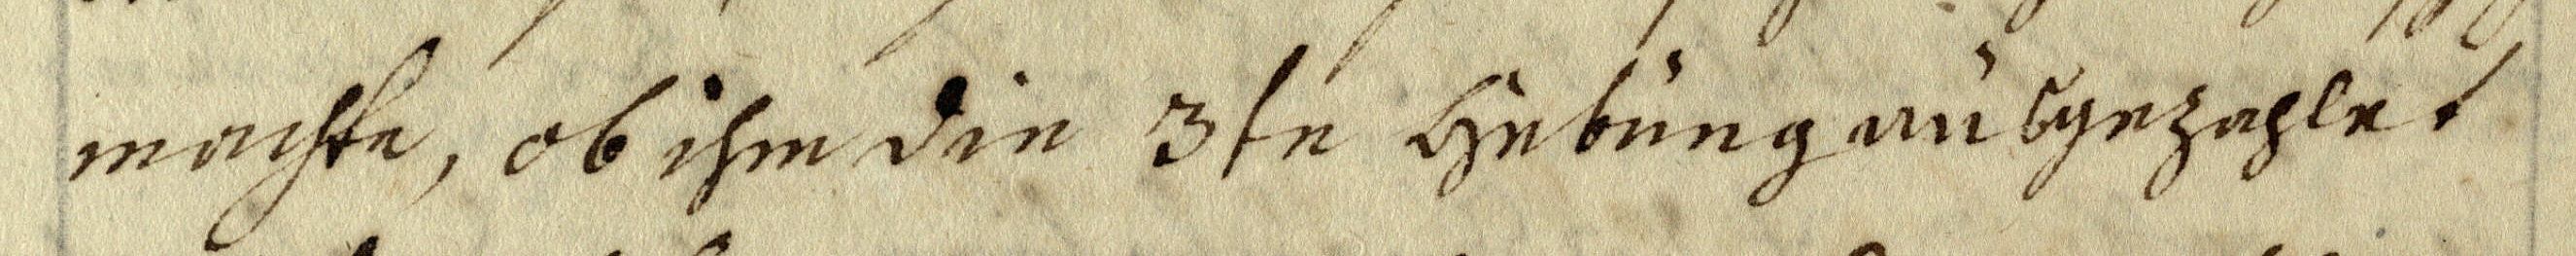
machte, ob ihm die 3 te Hebung ausgezahlet
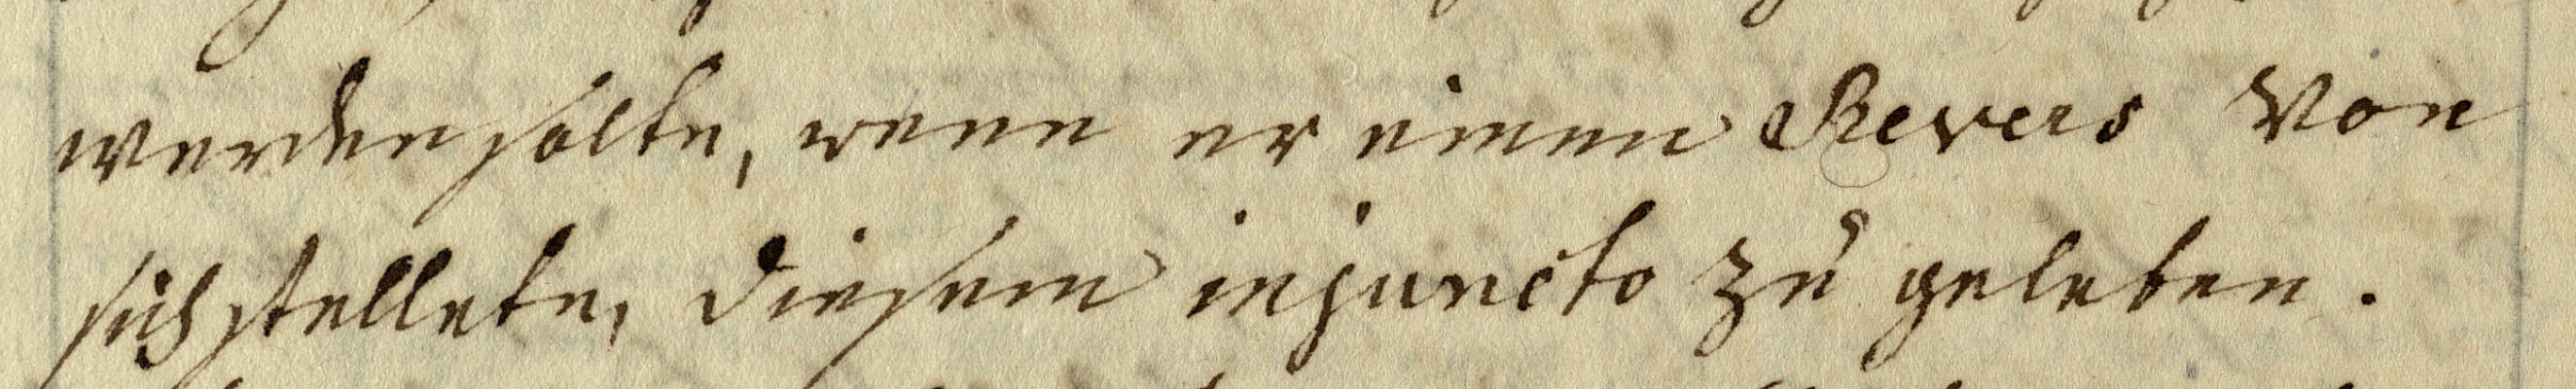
werden solte, wenn er einen Revers von
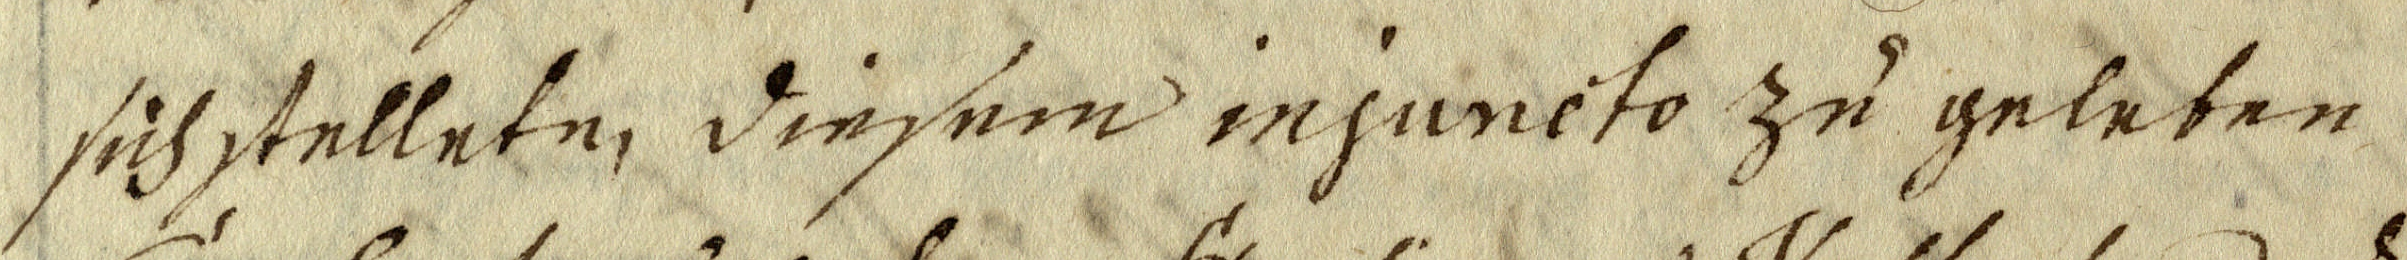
sich stellete, diesem injuncto zu geleben.
